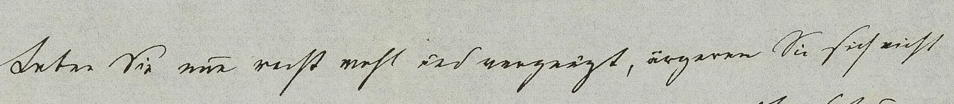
Leben Sie nun recht wohl und vergnügt, ärgeren Sie sich nicht
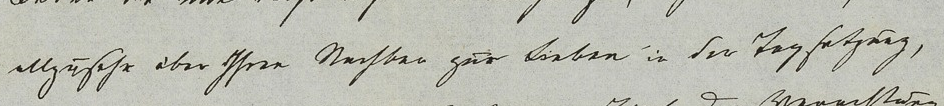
allzusehr über Ihren Nachbar zur Linken in der Tagsatzung,
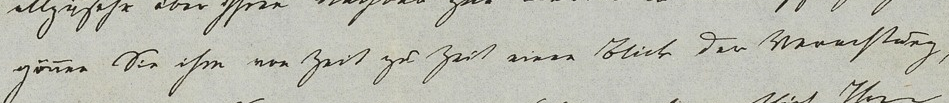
gönnen Sie ihm von Zeit zu Zeit einen Blick der Verachtung,
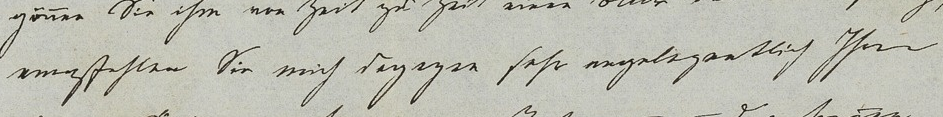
empfehlen Sie mich dagegen sehr angelegentlich Ihren
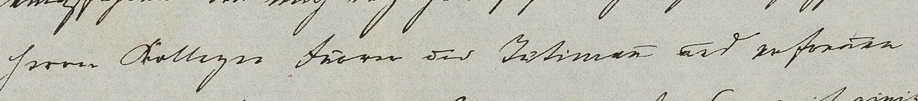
Herren Kollegen Furrer und Rütimann und erfreuen
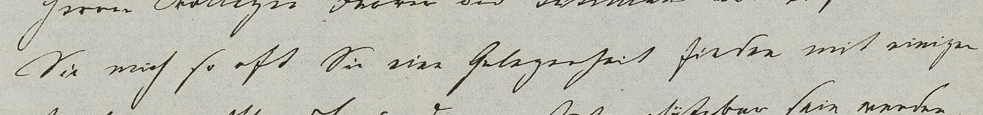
Sie mich so oft Sie eine Gelegenheit finden mit einigen
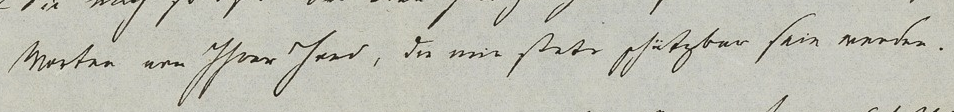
Worten von Ihrer Hand, die mir stets schätzbar sein werden.
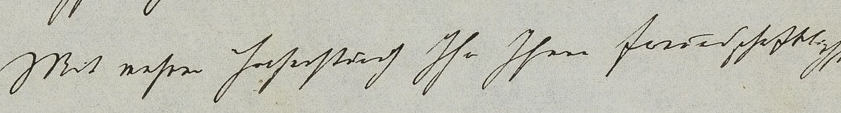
Mit wahrer Hochachtung Ihr Ihnen freundschaftlichst
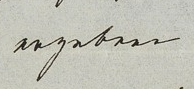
ergebene
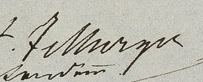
Zellweger
